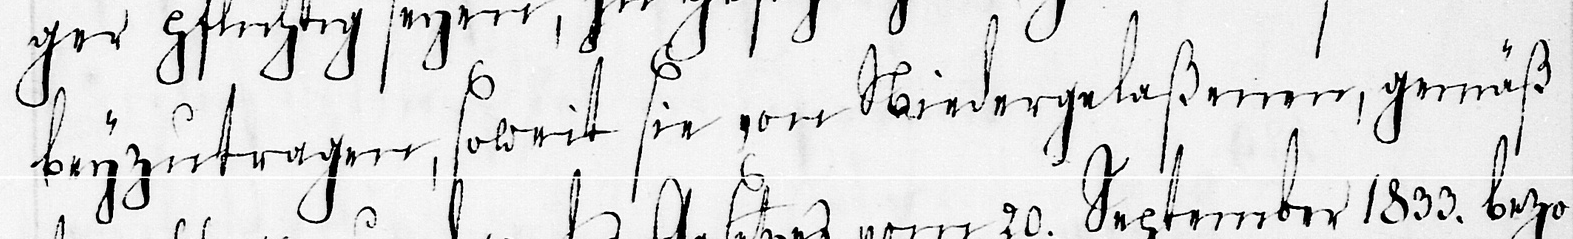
beyzutragen, soweit sie von Niedergelaßenen, gemäß
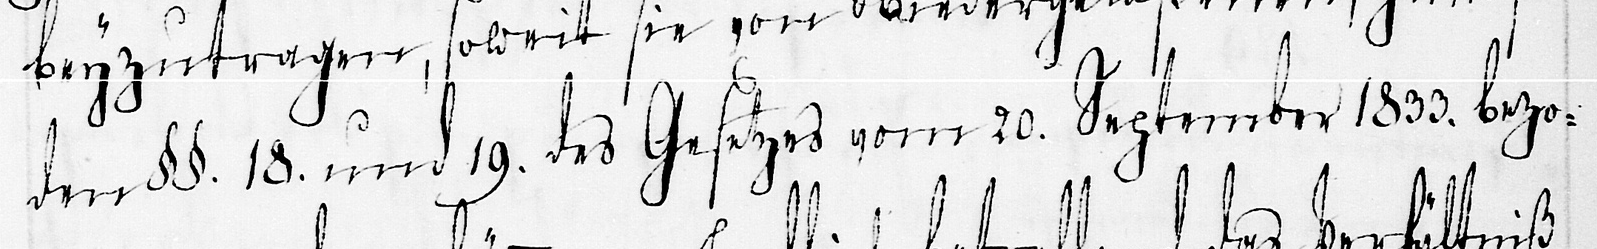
den §§. 18. und 19. des Gesetzes vom 20. September 1833. bezo¬
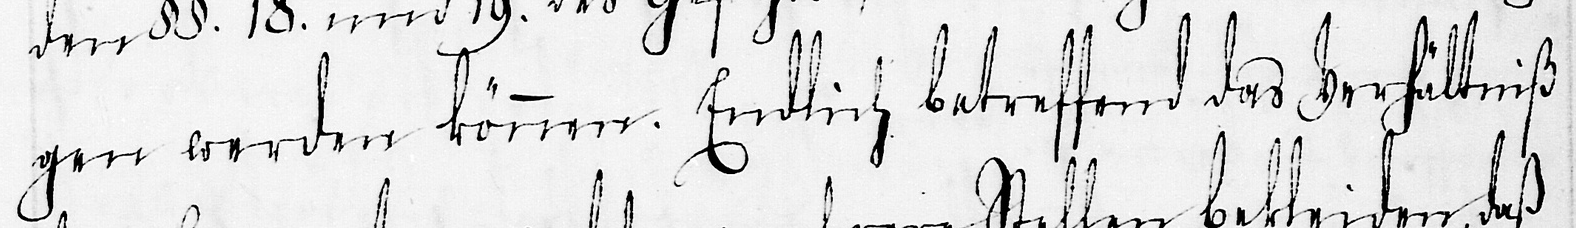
gen werden können. Endlich betreffend das Verhältniß
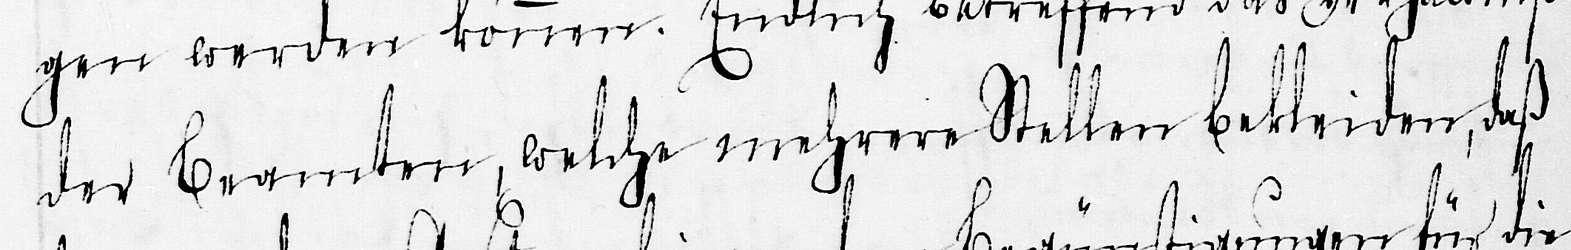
der Beamten, welche mehrere Stellen bekleiden, daß
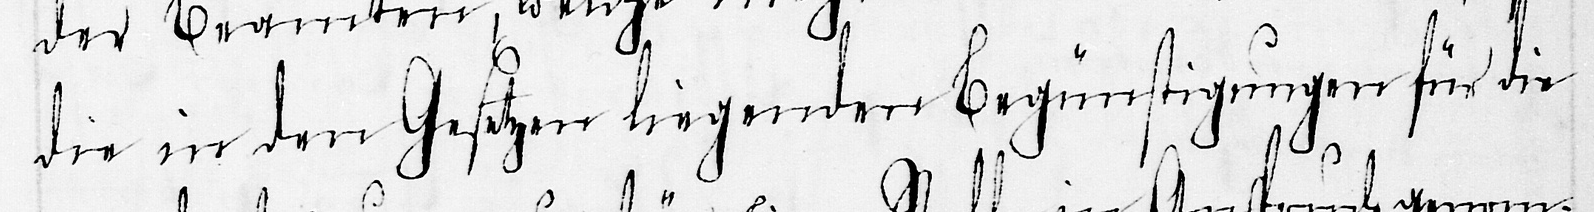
die in den Gesetzen liegenden Begünstigungen für die
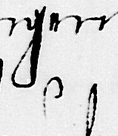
e¬
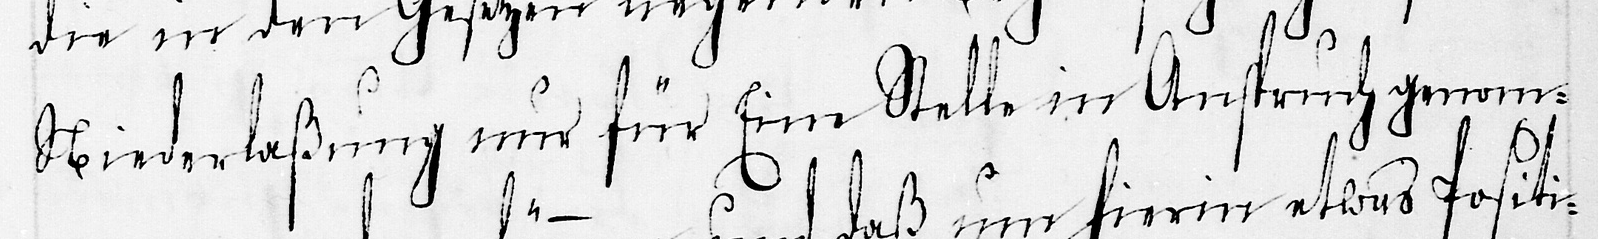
Niederlaßung nur für Eine Stelle in Anspruch genom¬
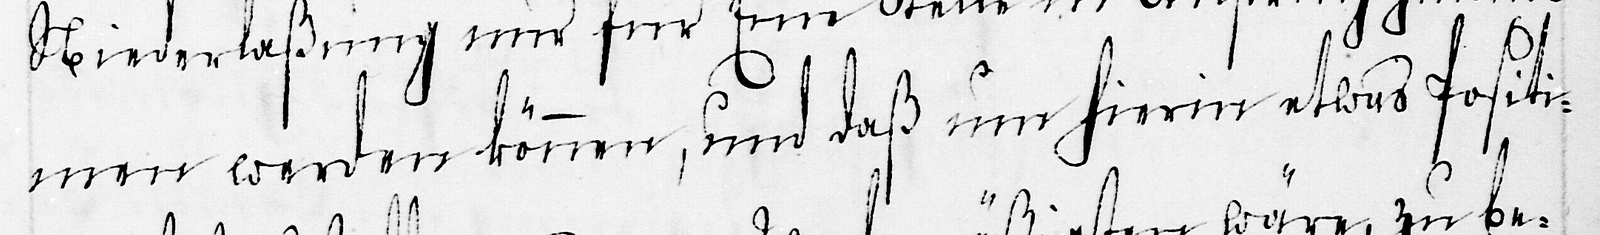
men werden können, und daß um hierin etwas Positi¬
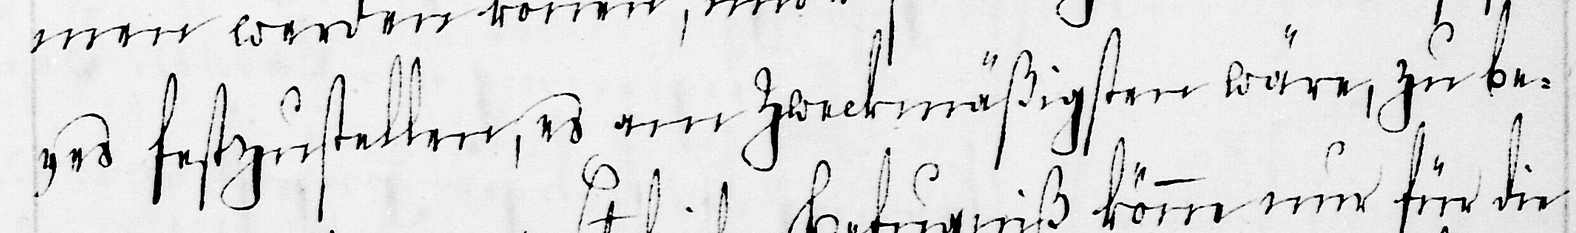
ves festzustellen, es am Zweckmäßigsten wäre, zu be¬
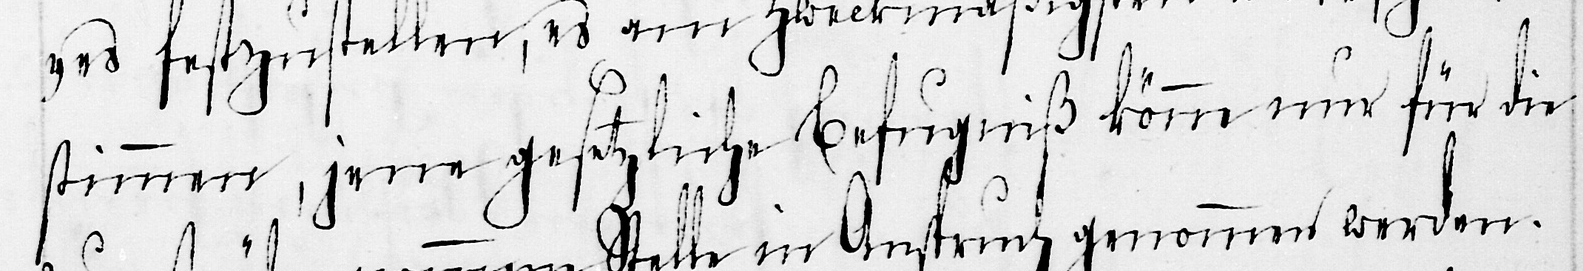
stimmen, jene gesetzliche Befugniß könne nur für die
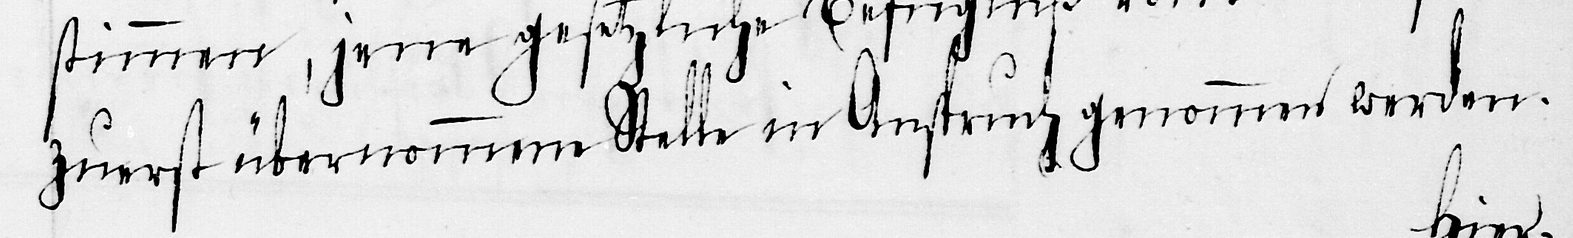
zuerst übernommene Stelle in Anspruch genommen werden.
